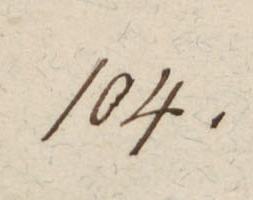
104.
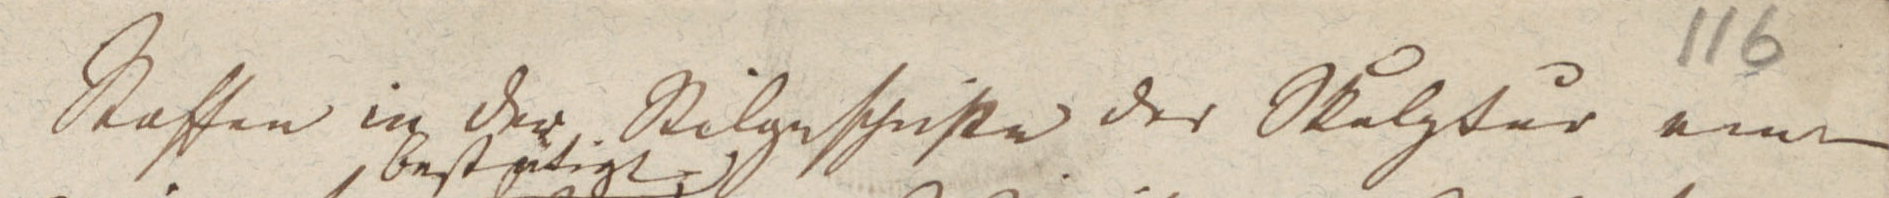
Stoffen in der Stilgeschichte der Skulptur ein-
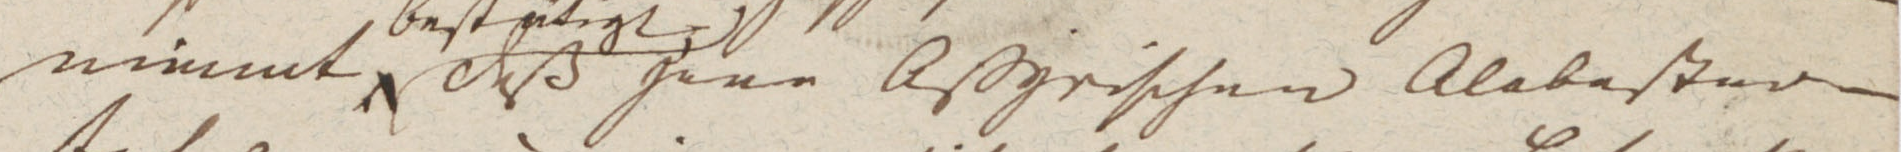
nimmt, bestätigt, dass jene Assyrischen Alabster-
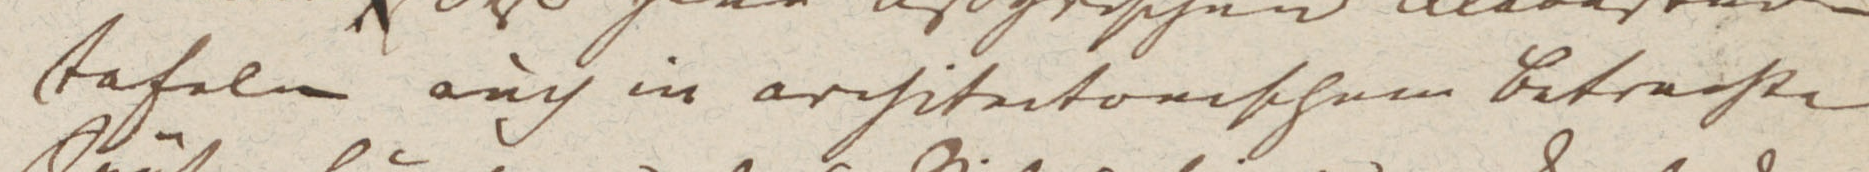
tafeln auch in architectonischem Betrachte
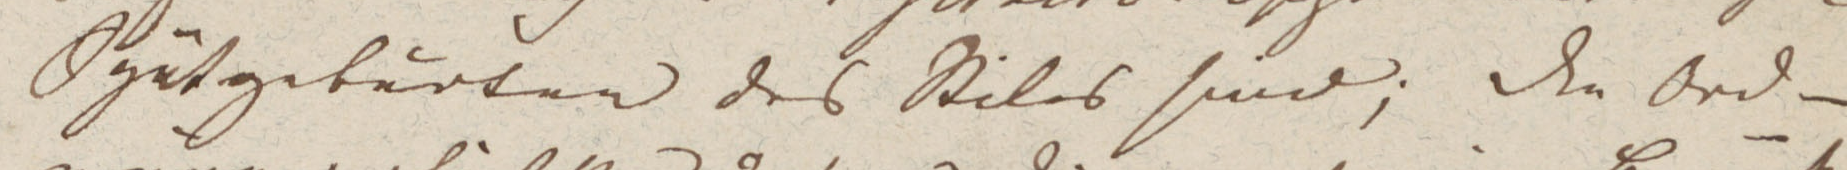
Spätgeburten des Stiles sind; Die Ord-
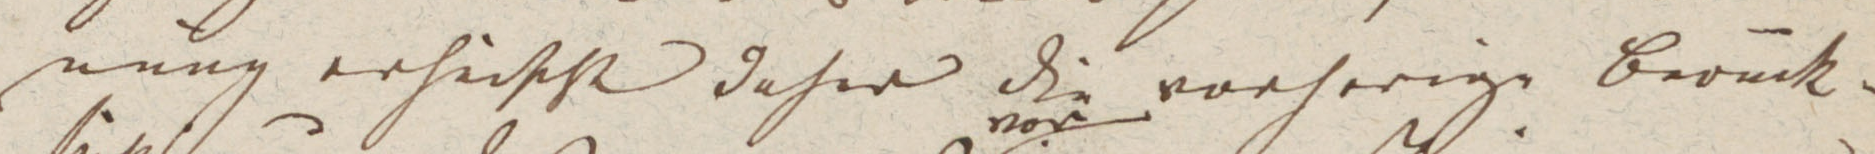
nung erheischt daher die vorherige Berück-
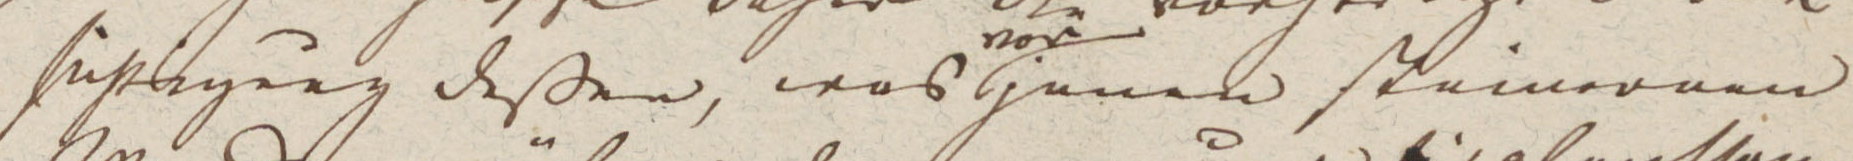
sichtigung dessen, was vor jenen steinernen
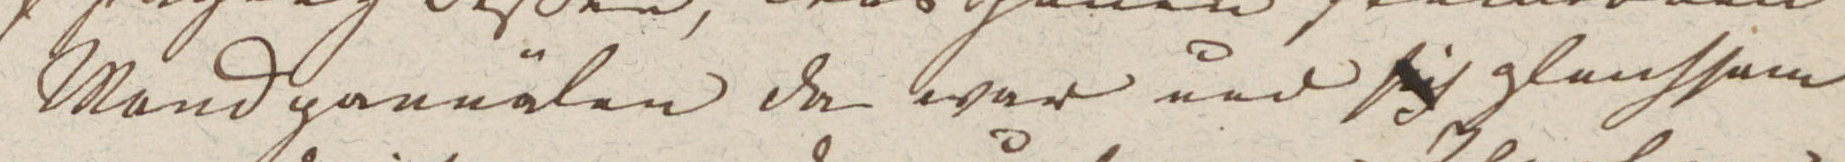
Wandpannälen da war und sich gleichsam
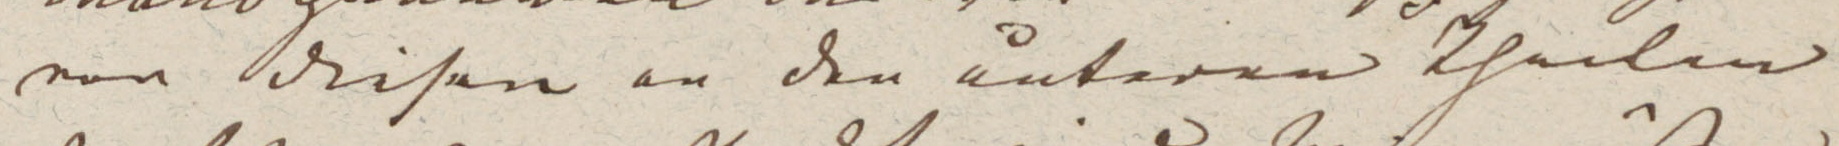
von diesen an den unteren Theilen
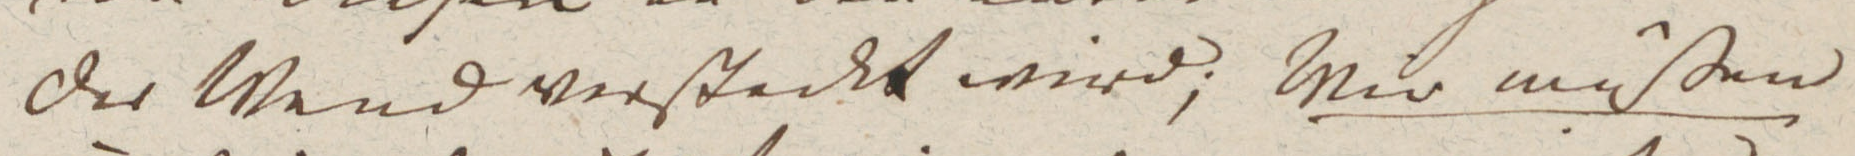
der Wand versteckt wird; Wir müssen
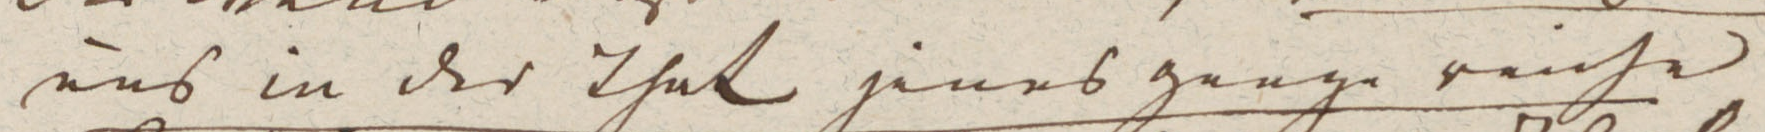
uns in der That jenes ganze reiche
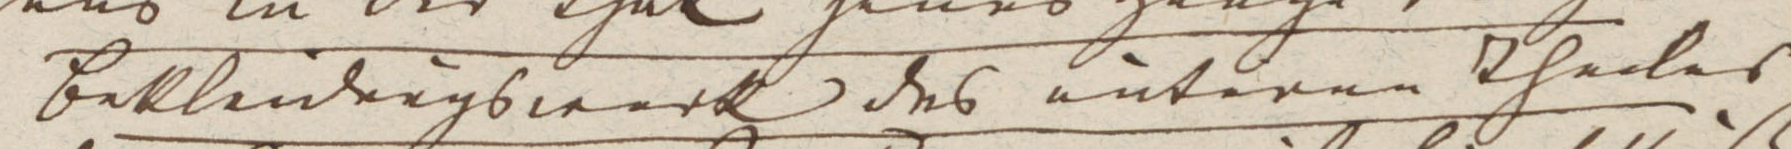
Bekleidungswerk des unteren Theiles
